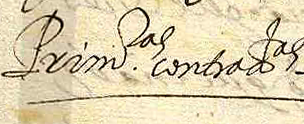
Prim.ras contrad̄as
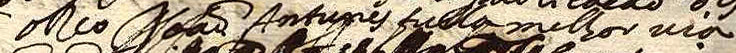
o Reo Joaõ Antunes pella melhor uia
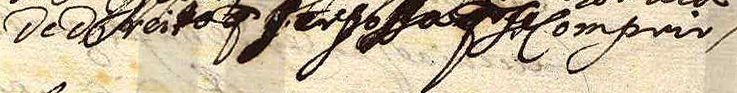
de direito q̄ _ar e possa q̄ se Comprir /
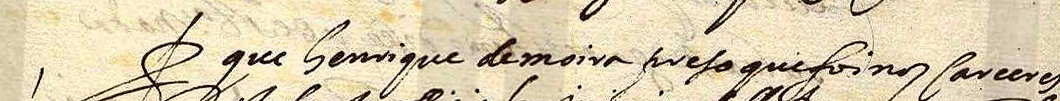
1 ꝓ que henrique de moira preso que foi nos Carceres
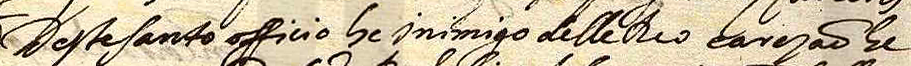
deste santo officio he inimigo delle Reo e a rezão he
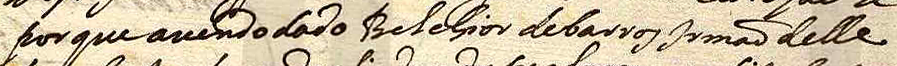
porque auendo dado Belchior de barros Jrmaõ delle
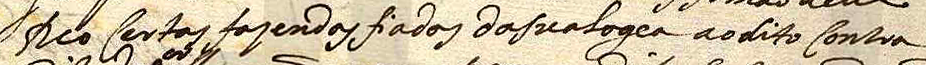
Reo Certas fazendas fiadas da sua Logea ao dito Contra
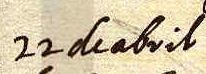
22 de abril
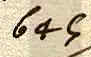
645
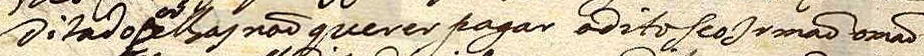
ditado por lhas não querer pagar o dito seo Jrmaõ o maõ
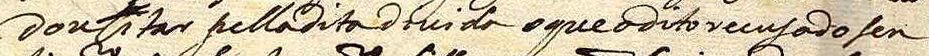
dou citar pella dita diuida o que o dito recusado sen
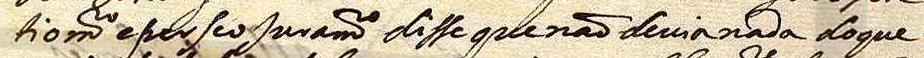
tio mto e per seo Juramto disse que naõ deuia nada do que
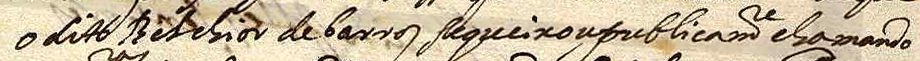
o dito Belchior de barros se queixou publicamte chamando
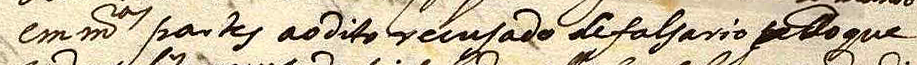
em mtas partes ao dito recusado de falsario pello que
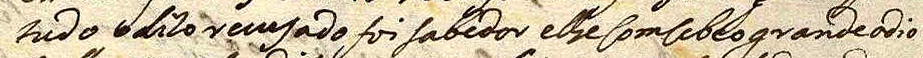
tudo o dito recusado foi sabedor e lhe Comcebeo grande odio
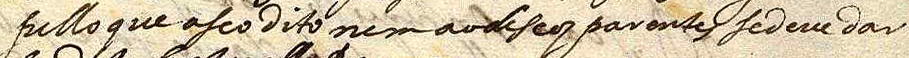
pello que a seo dito nem ao de seos parentes se deue dar
